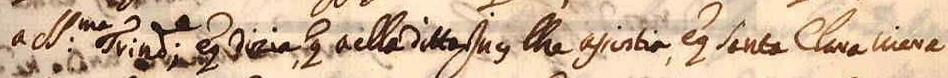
a SS.ma Trind.e, e q̄ dizia, q̄ a ella ditta Jnes lhe assistia, e q̄ Santa Clara uiera
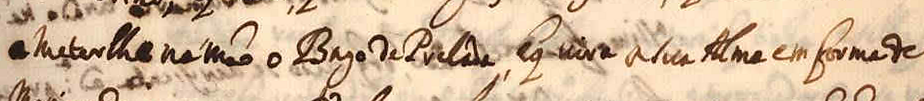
a meterlhe na maõ o Bago de Prelada, e q̄ uira a sua Alma em forma de
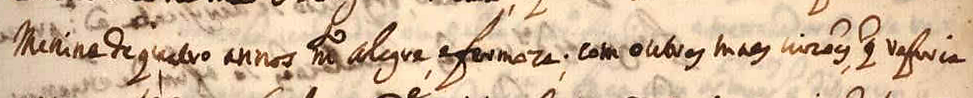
Menina de quatro annos mto alegre, e fermoza; com outras mais uizoẽs, q̄ referia
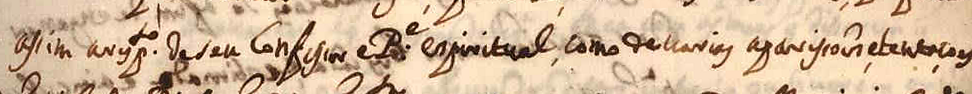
assim a resp.to de seu Confessor e P.e espiritual, como de uarias aparissoẽs e tentaçoẽs
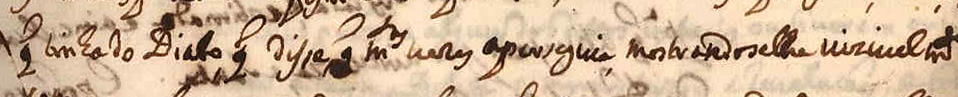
q̄ tinha do Diabo, q̄ disse q̄ mtas uezes a perseguia, mostrando se lhe uiziuelmte
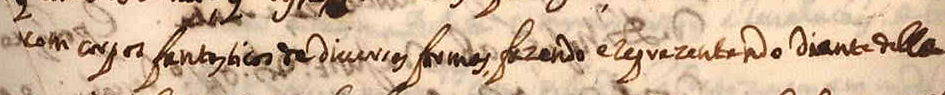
com corpos fantasticos de diuersas formas, fazendo e reprezentando diante della
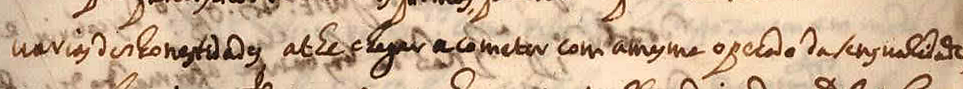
uarias deshonestidades athe chegar a cometer com a mesma o pecado da sensualidade
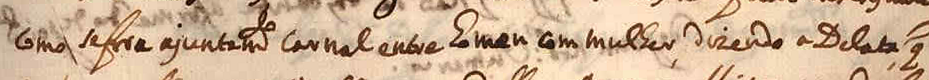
como se fora ajuntam.to carnal entre homen com mulher, dizendo a Delata, q̄
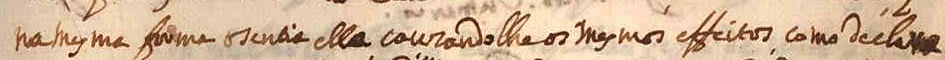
na mesma forma o sentia ella, cauzandolhe os mesmos effeitos, como declara
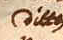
dittas
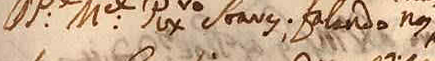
O P.e M.el Pexro Soares, falando nas
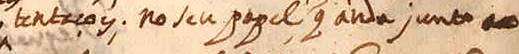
tentaçoẽs; no seu papel, q̄ anda junto ao
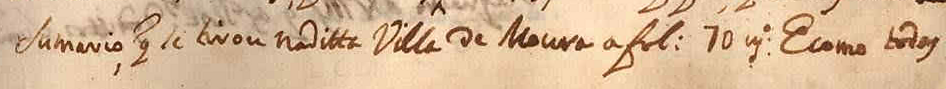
Sumario, q̄ se tirou na ditta Villa de Moura a fol. 70 us.o E como todas
